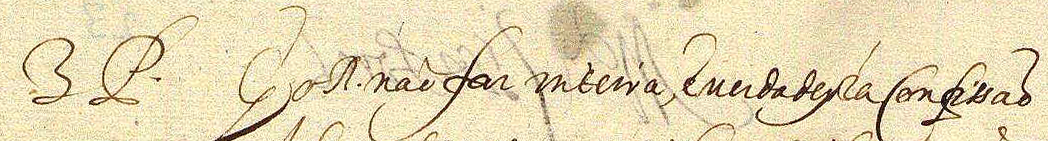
3 P. Q̄ o R. naõ faz inteira, e uerdadeyra Confissaõ
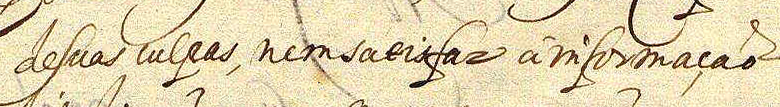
de suas culpas, nem satisfaz a informaçaõ
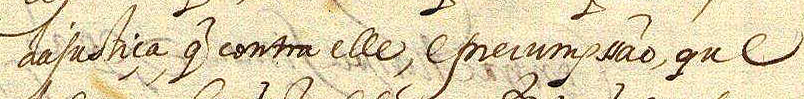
da justiça, q̄ contra elle, e prezumpssaõ, que
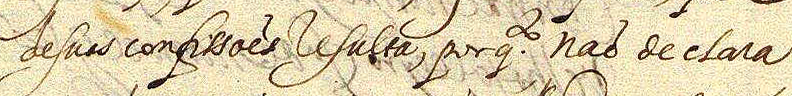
de suas confissoẽs Resulta, porq.to naõ declara
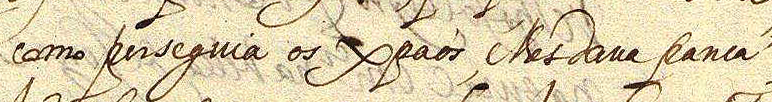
como perseguia os Xpaõs, e lhes daua panca
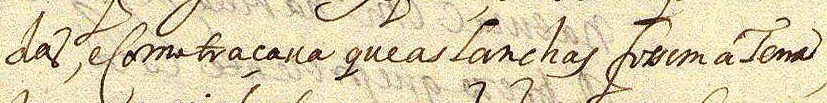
das, e Como traçaua que as lanchas fossem a Terra
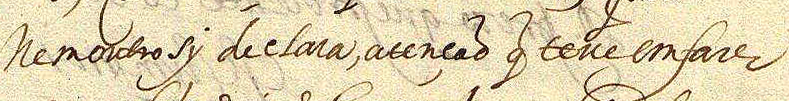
nem outrosy declara, a tençaõ q̄ teue em fazer
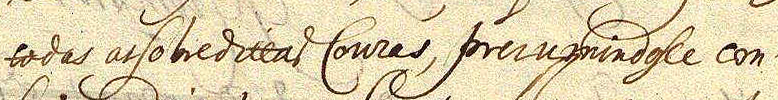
todas as Sobredittas Couzas, prezumindosse con
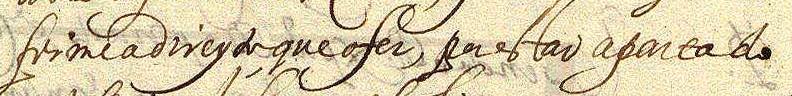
forme a direyto, que o fez, por estar apartado
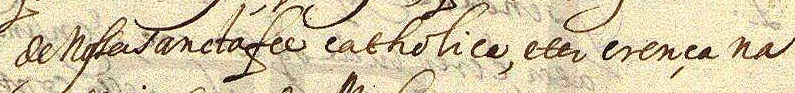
de nossa sancta fee catholica, e ter crença na
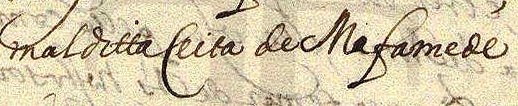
malditta Ceita de Mafamede
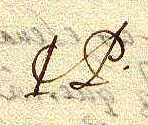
4 P.
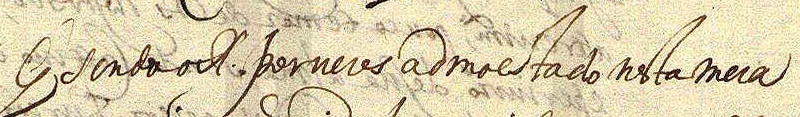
Q̄ sendo o R. por uezes admoestado nesta meza
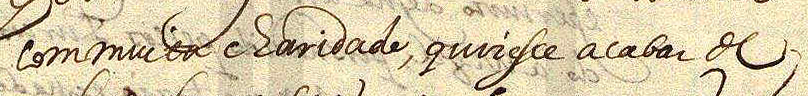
com muita charidade, quizesse acabar de
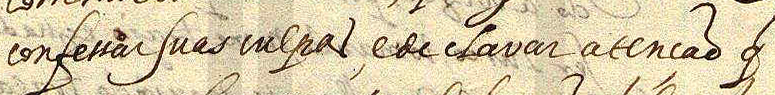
confessar Suas culpas, e declarar a tençaõ q̄
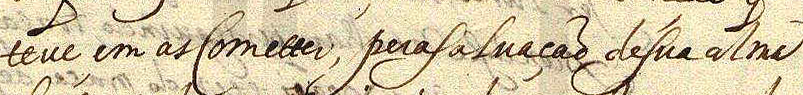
teue em as Cometter, pera Saluação de Sua alma
